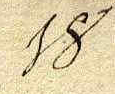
18
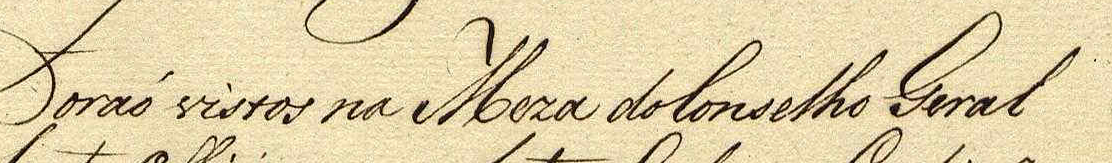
Foraõ vistos na Meza do Conselho Geral
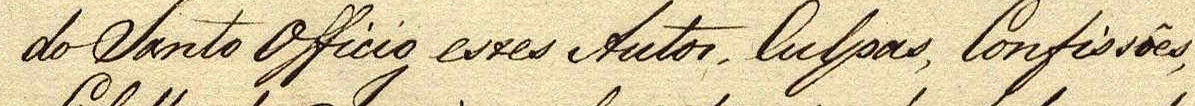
do Santo Officio estes Autos, Culpas, Confissões,
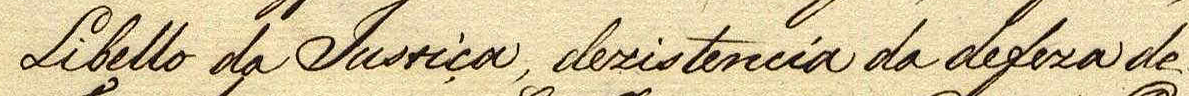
Libello da Iustiça, dezistencia da defeza de
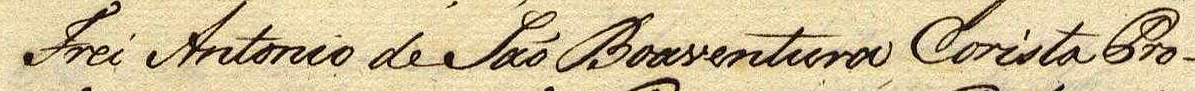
Frei Antonio de Saõ Boaventura, Corista Pro
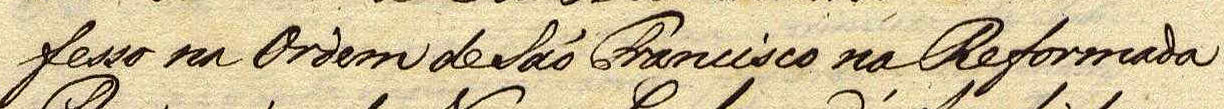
fesso na Ordem de Saõ Francisco na Reformada
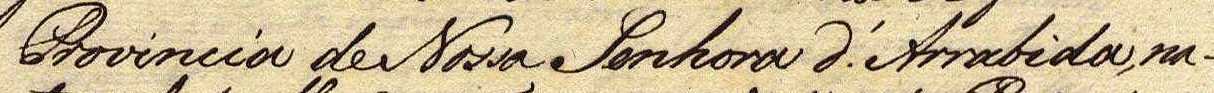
Provincia de Nossa Senhora d'Arrabida, na
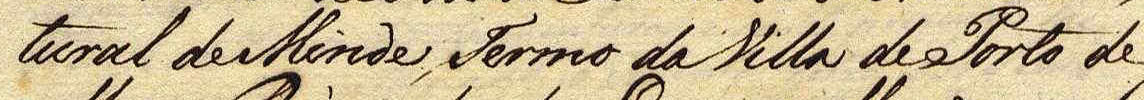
tural de Minde, Termo da Villa de Porto de
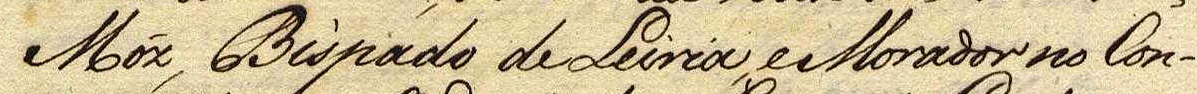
Móz, Bispado de Leiria, e Morador no Con
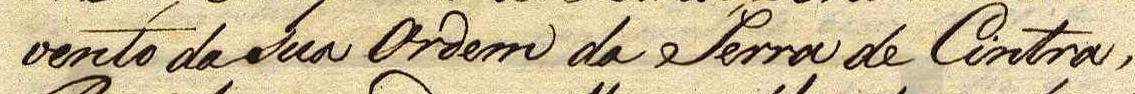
vento da sua Ordem da Serra de Cintra,
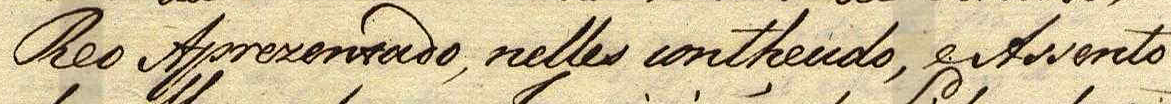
Reo Aprezentado, nelles contheudo, e Assento
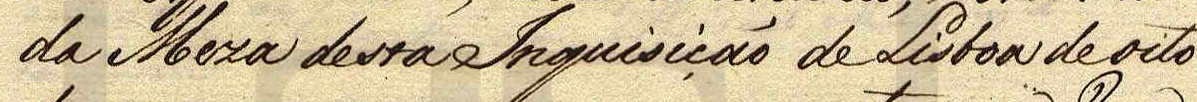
da Meza desta Inquisiçaõ de Lisboa de oito
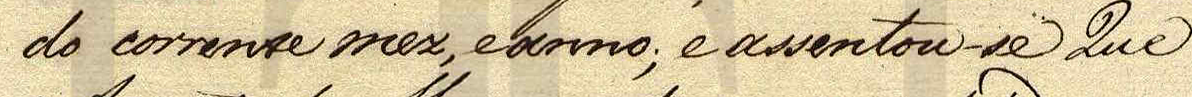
do corrente mez, e anno; e assentou-se Que
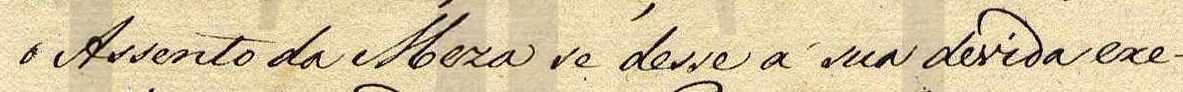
o Assento da Meza se desse a sua devida exe
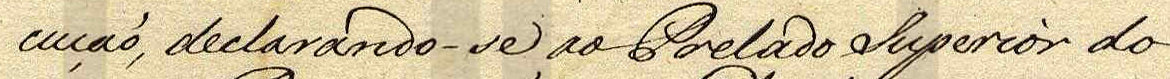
cuçaõ, declarando-se ao Prelado Superior do
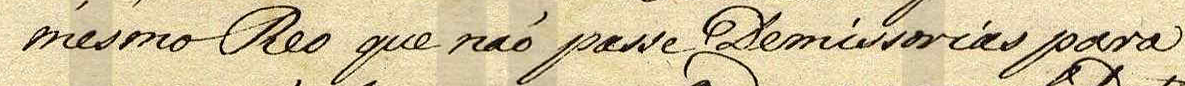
mesmo Reo que naõ passe Demissorias para
